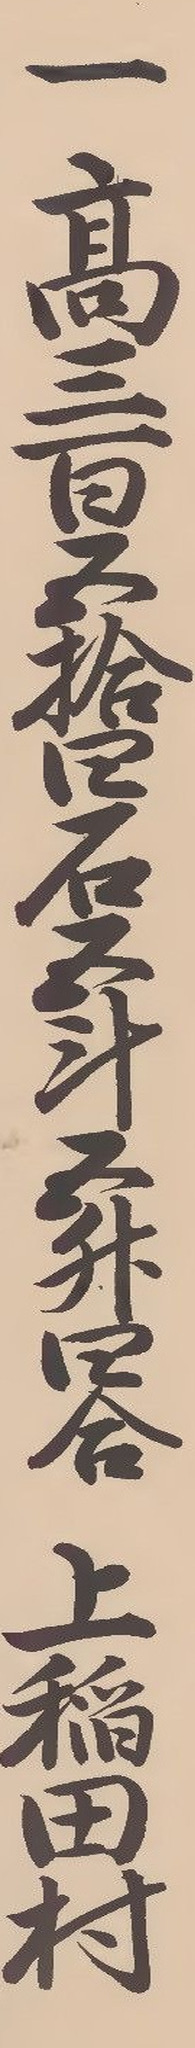一高三百五拾四石五斗五升四合上稲田村
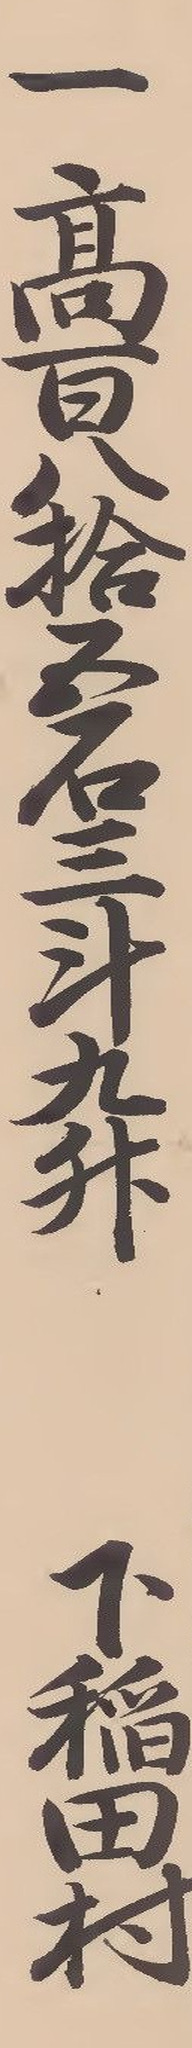一高百八拾五石三斗九升下稲田村
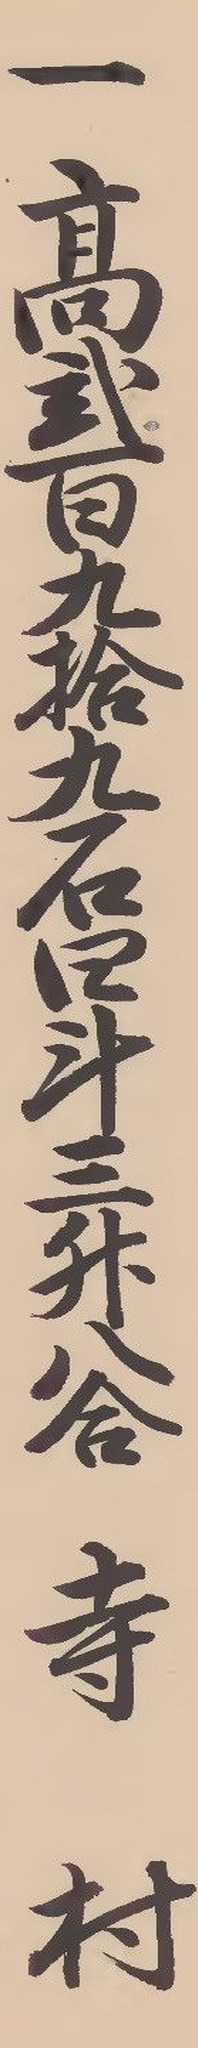一高弐百九拾九石四斗三升八合寺村
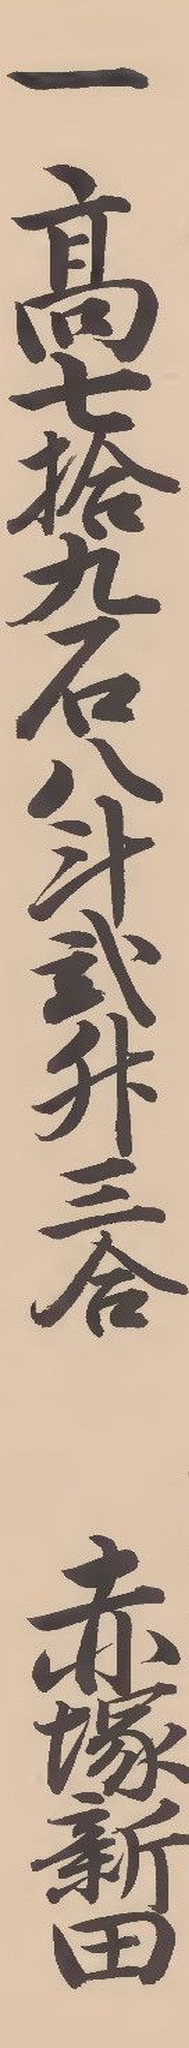一高七拾九石八斗弐升三合赤塚新田
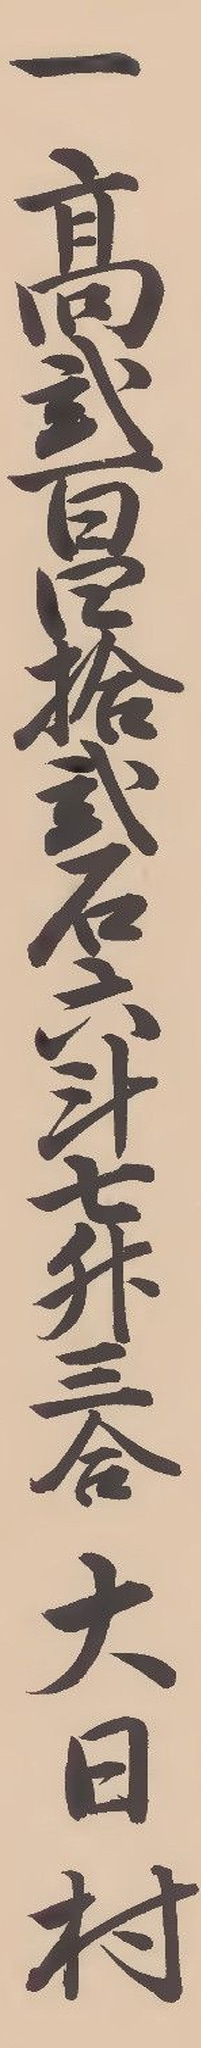一高弐百四拾弐石六斗七升三合大日村

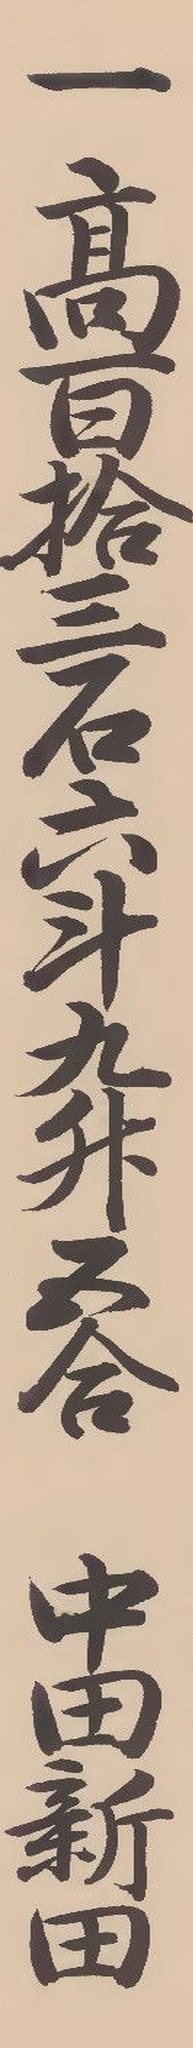一高百拾三石六斗九升五合中田新田
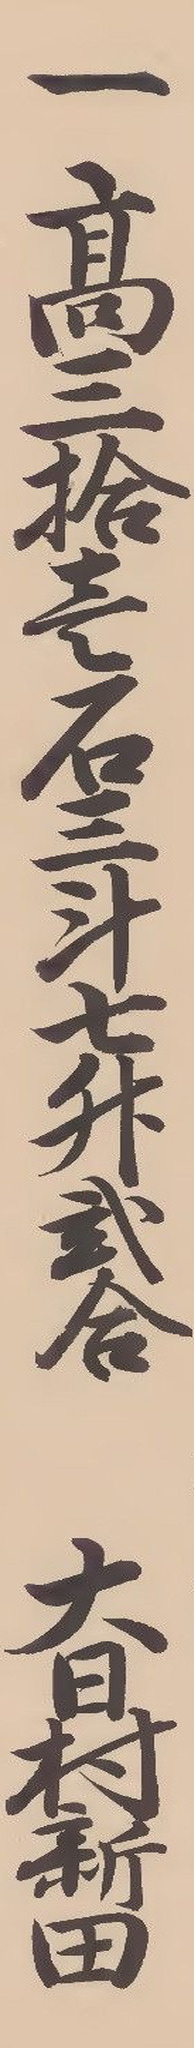一高三拾壱石三斗七升弐合大日村新田
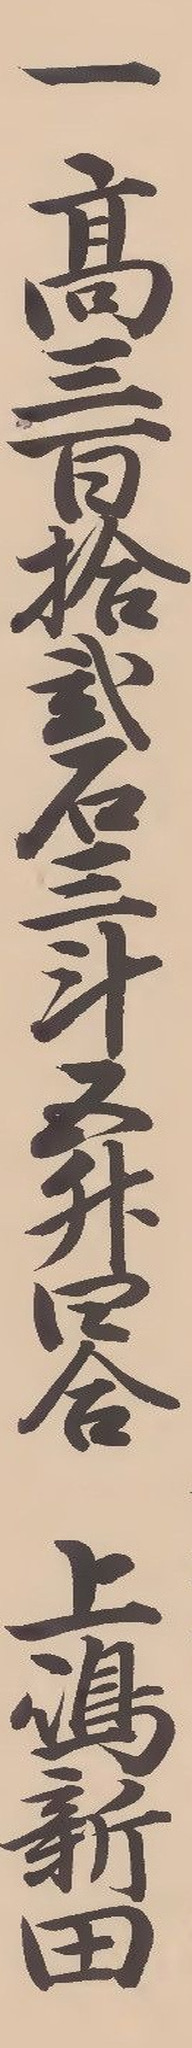一高三百拾弐石三斗五升四合上島新田
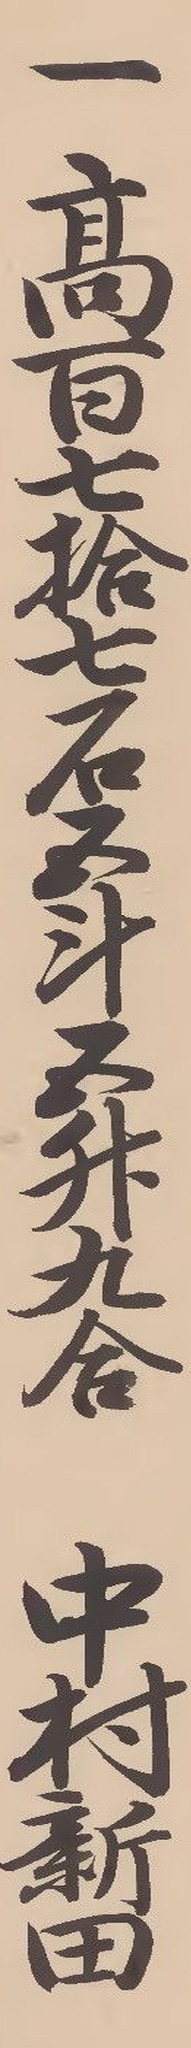一高百七拾七石五斗五升九合中村新田
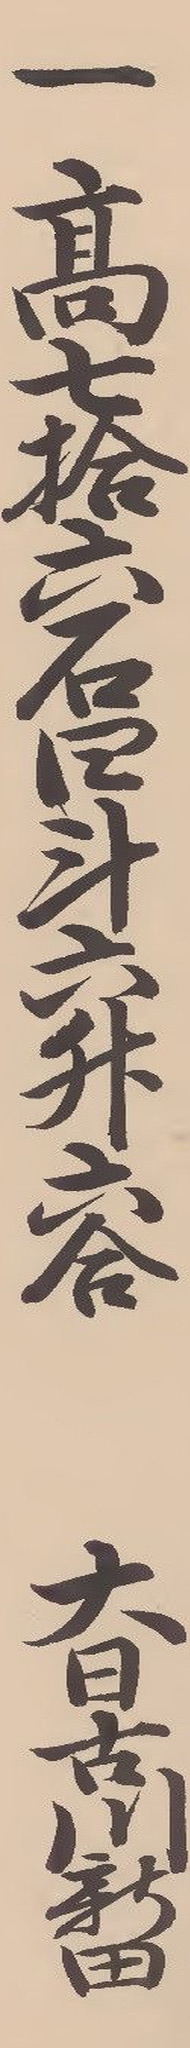一高七拾六石四斗六升六合大日古川新田
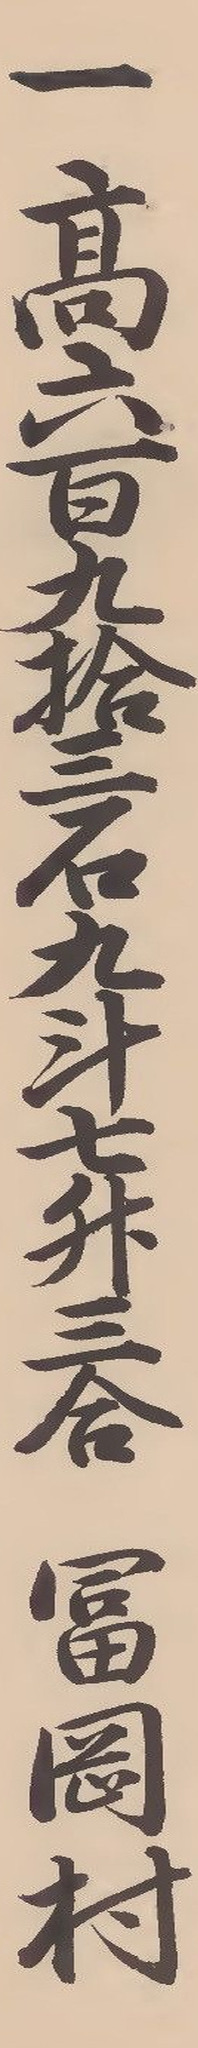一高六百九拾三石九斗七升三合富岡村
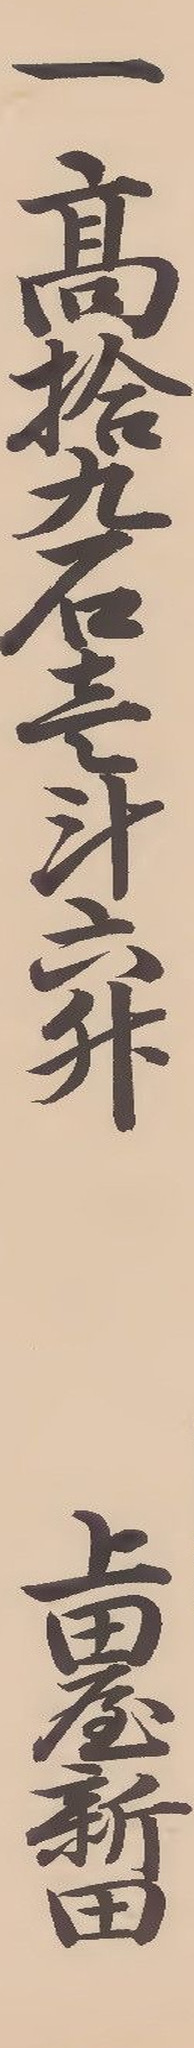一高拾九石壱斗六升上田屋新田
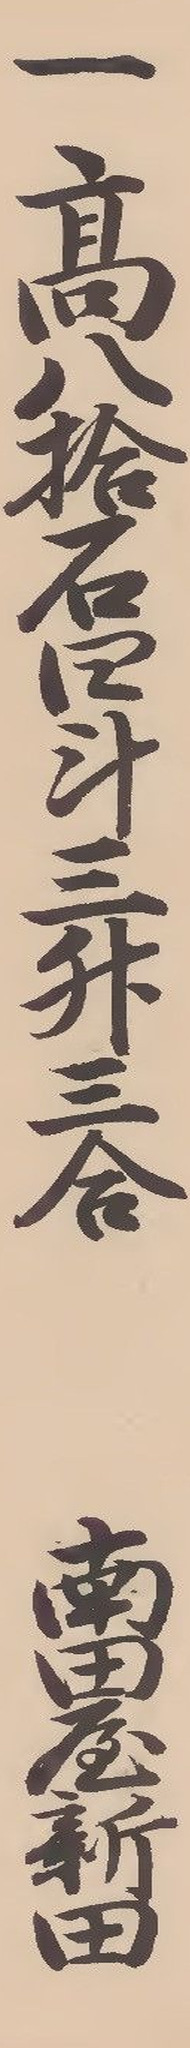一高八拾石四斗三升三合南田屋新田

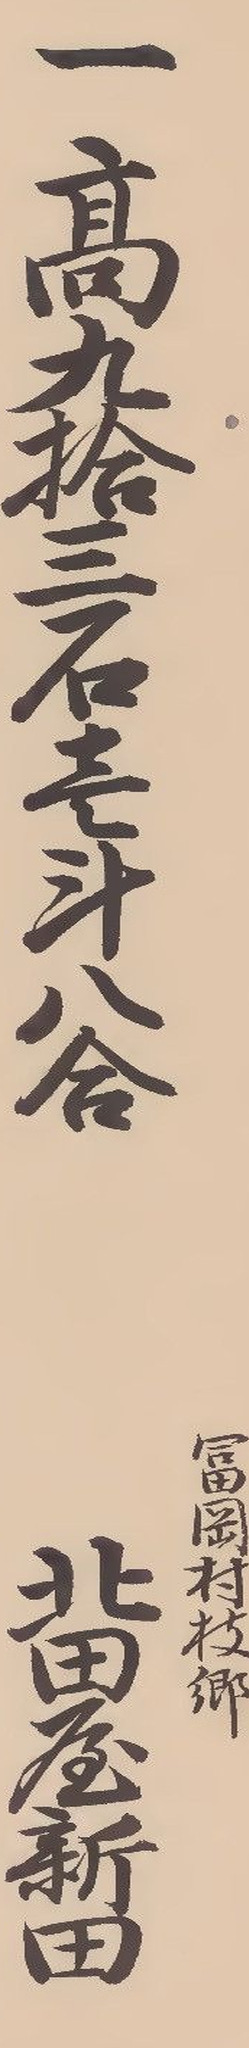一高九拾三石壱斗八合北田屋新田
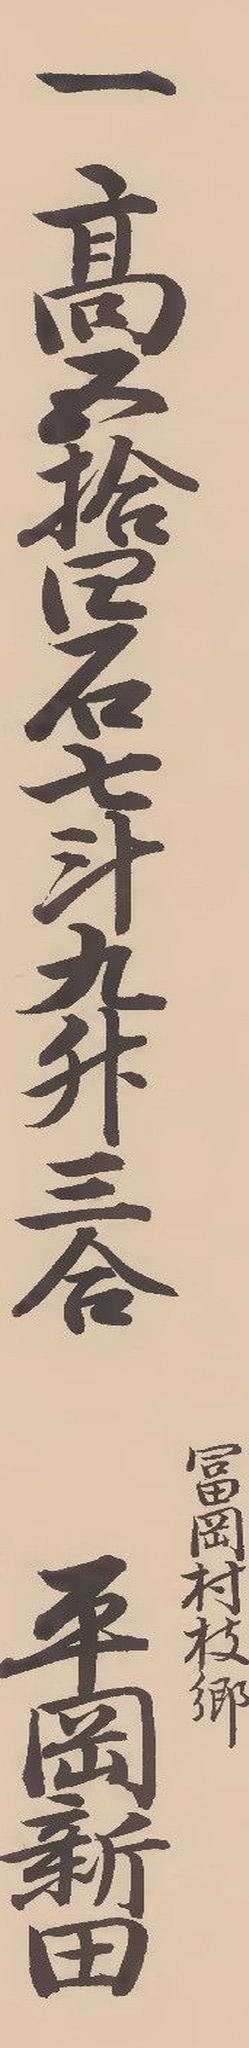一高五拾四石七斗九升三合平岡新田
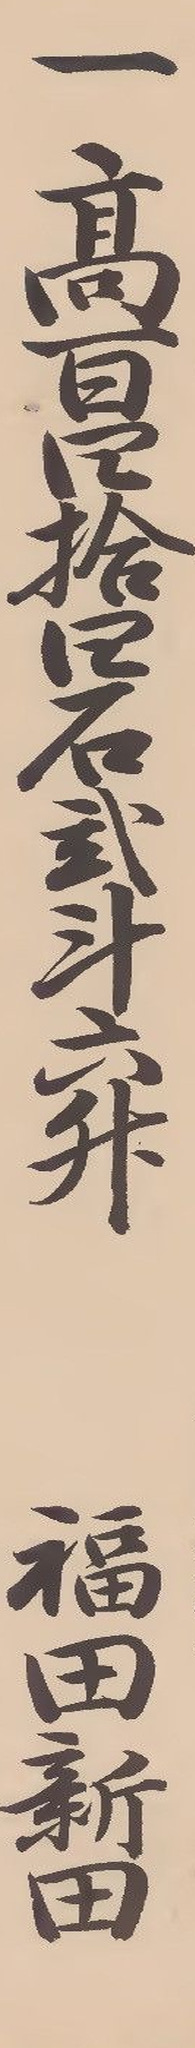一高百四拾四石弐斗六升福田新田
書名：越後国郷帳　上
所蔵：国立公文書館 National Archives of Japan
